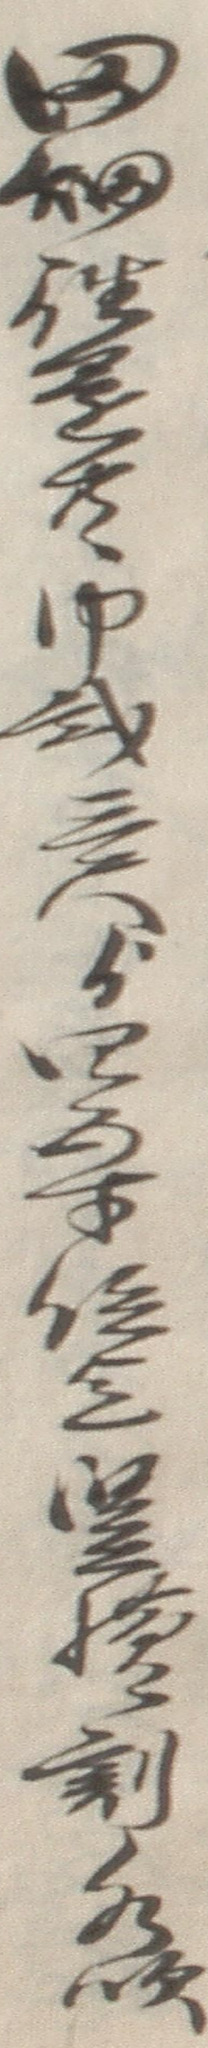田畑往還共巾弐三尺ゟ四五寸位迄竪損候剰水吹
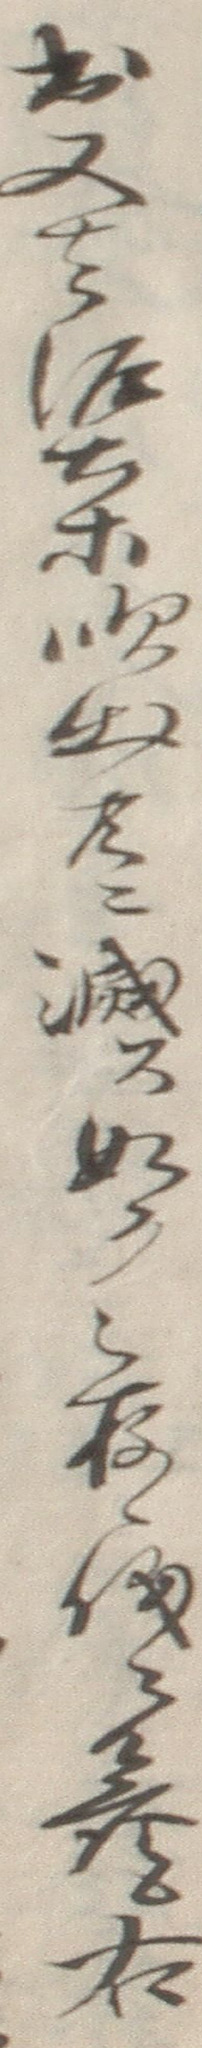出又は泥土等吹出共二減ス如ク存候儀二御座候右
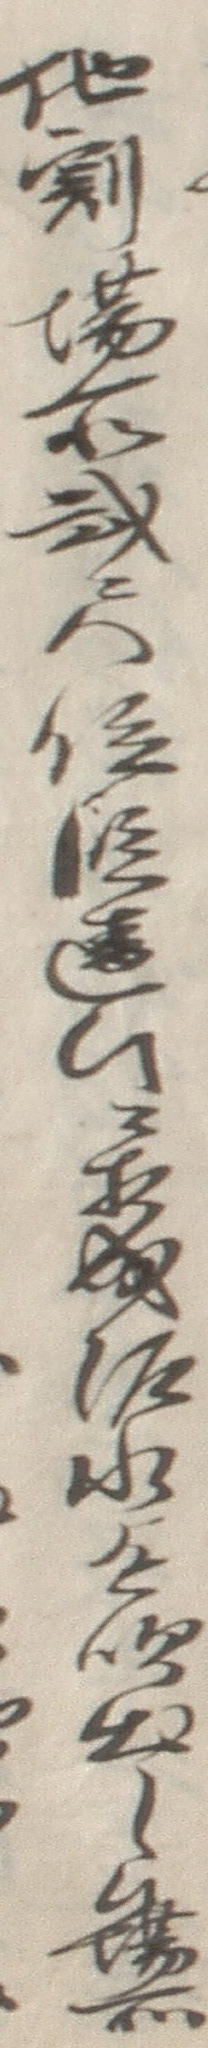地割場所弐尺位段違ひ二相成泥水を吹出し候場所
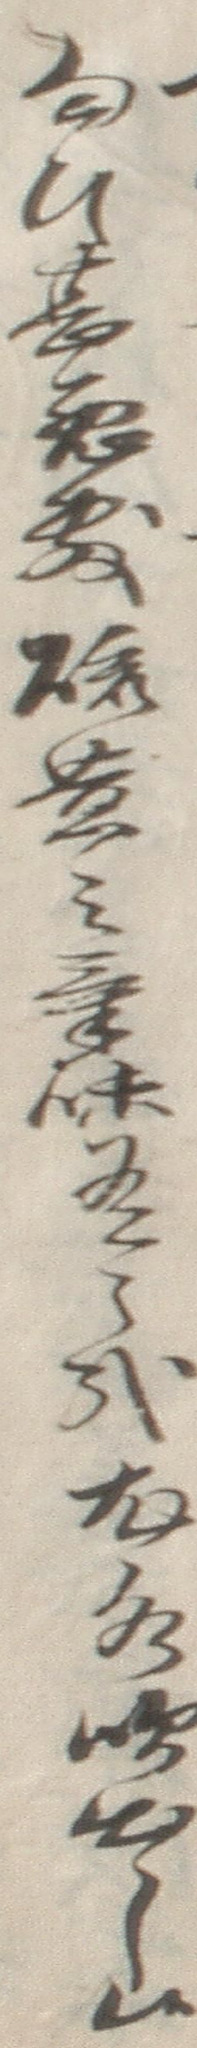匂ひ甚悪敷硫黄之気味有之哉尤水吹出し候
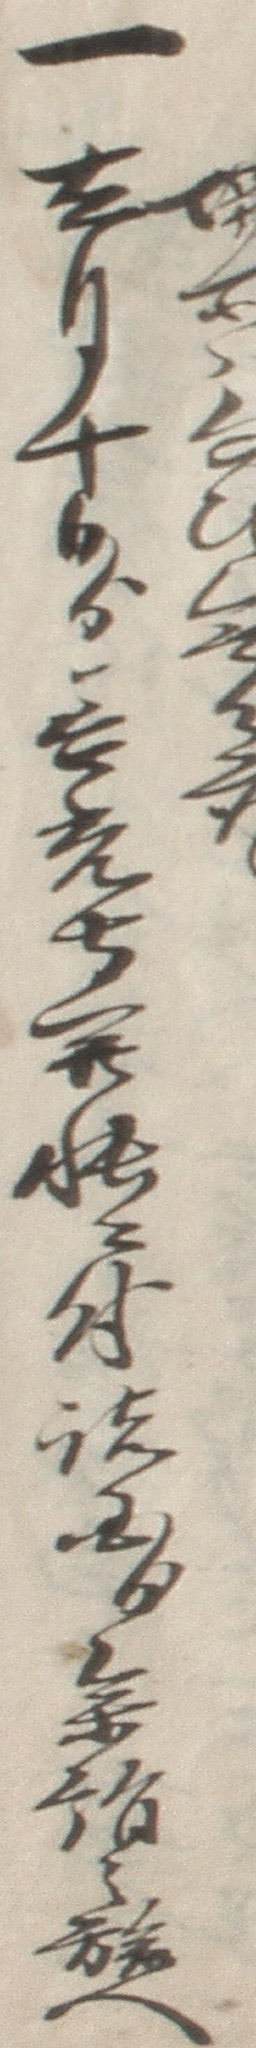一去月十日ゟ善光寺開帳二付諸国ゟ参詣之旅人

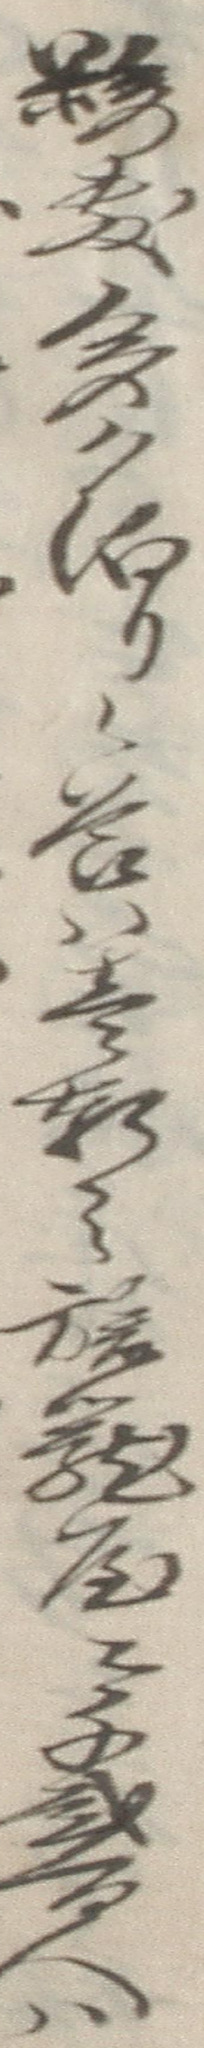夥敷多ク泊り候節ハ壱軒之旅籠屋二千二百人ハ
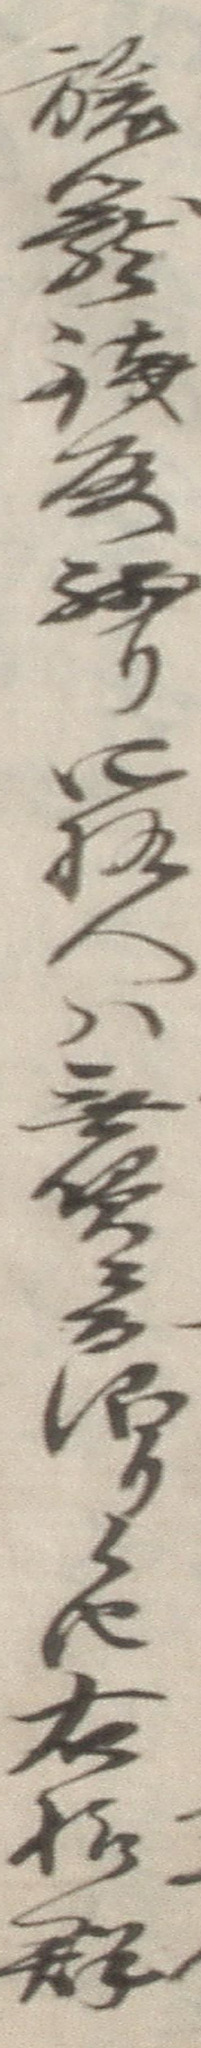旅籠銭取残り四拾人ハ無賃二而泊り候由右様群
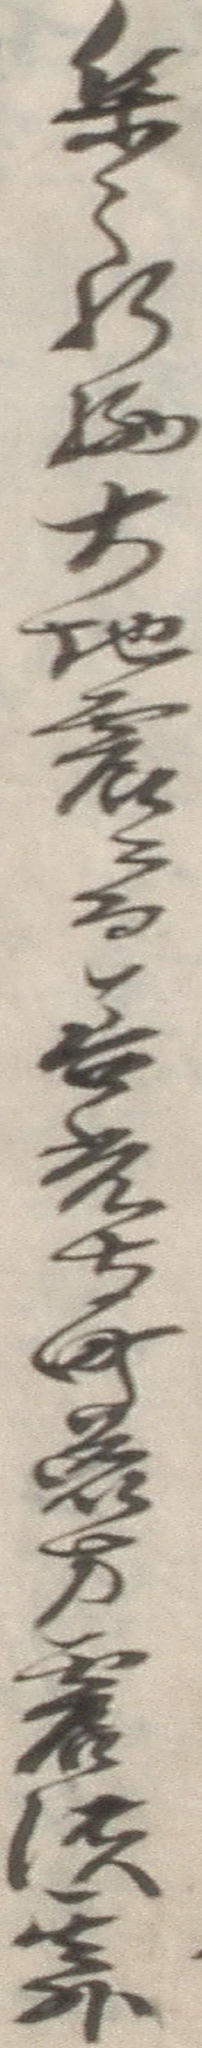集之折柄大地震二而善光寺町裏方震潰其外
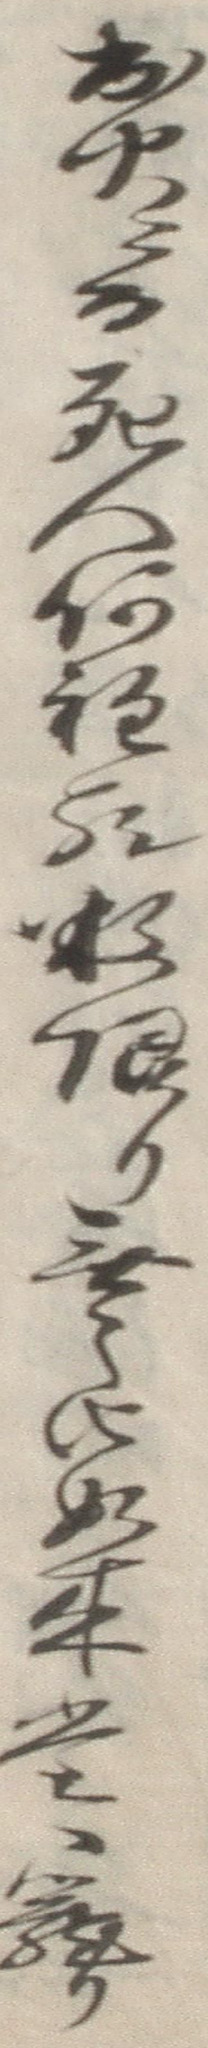出火二而死人何程歟数限り無之由如来堂ㇸ籠り
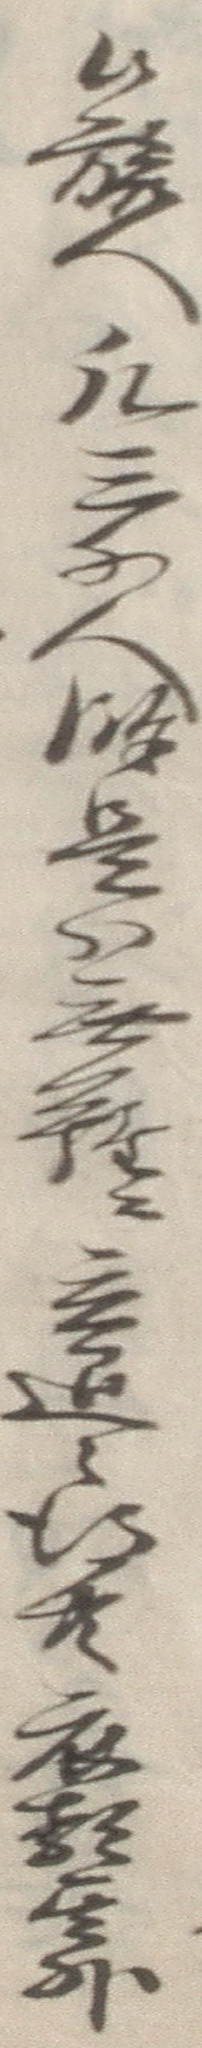候旅人凡三千人余是ハ無難二立退候得共衣類其外
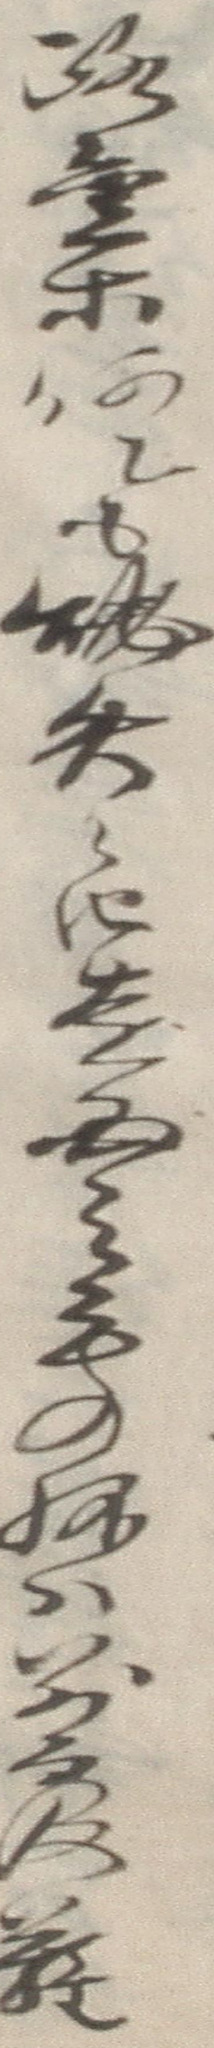路金等何ㇾも焼失之由遠国之もの抔ハ別而及難
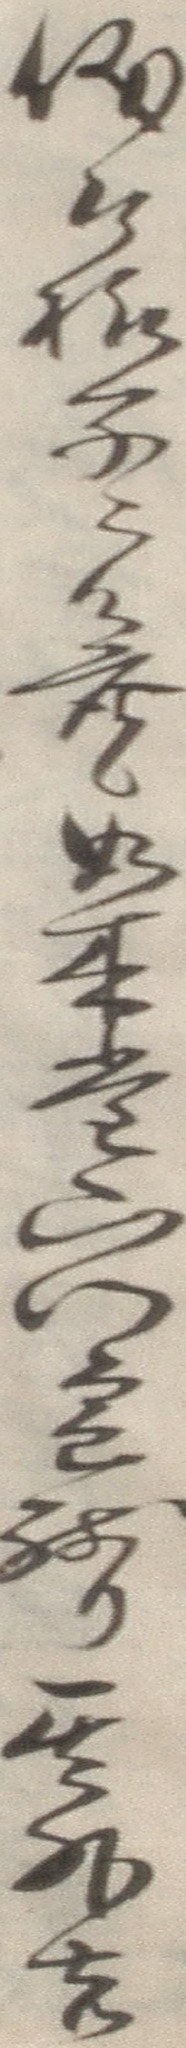儀候様子二御座候如来堂山門而已残り其外は
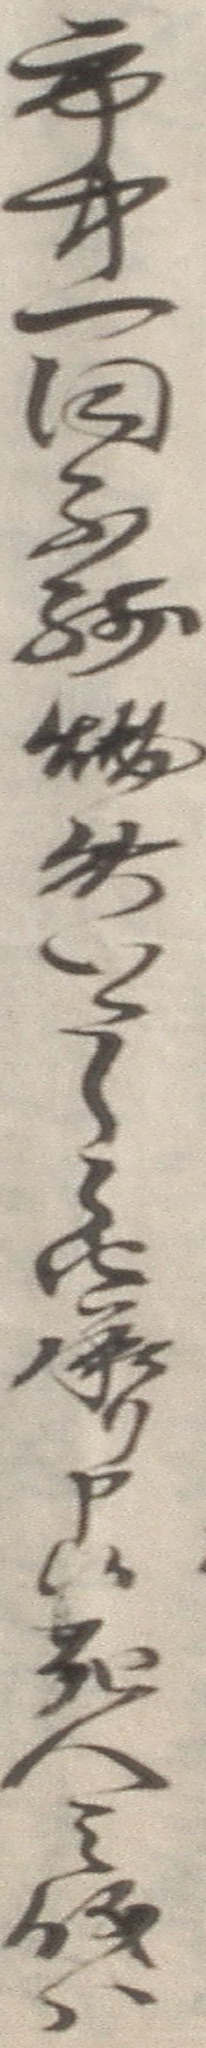市中一同不残焼失いたし候由承り申候死人之儀ハ
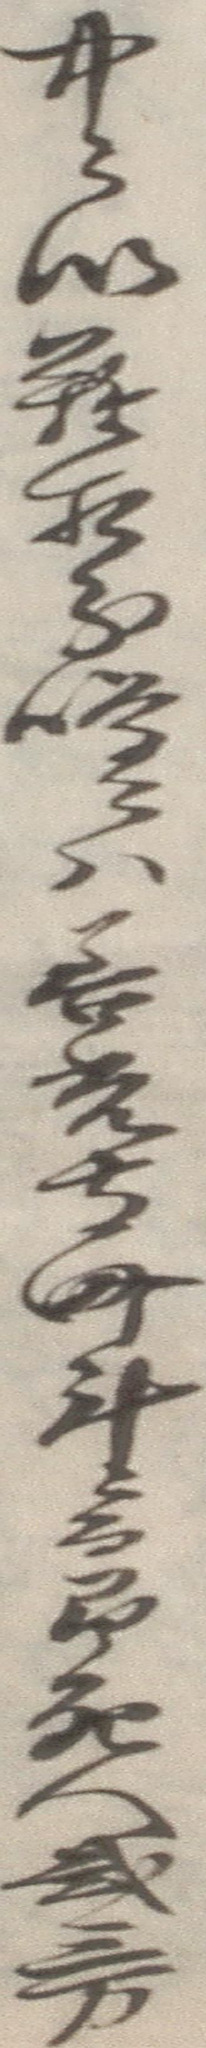中々以難相分噂二ハ善光寺町計二而即死人弐三万
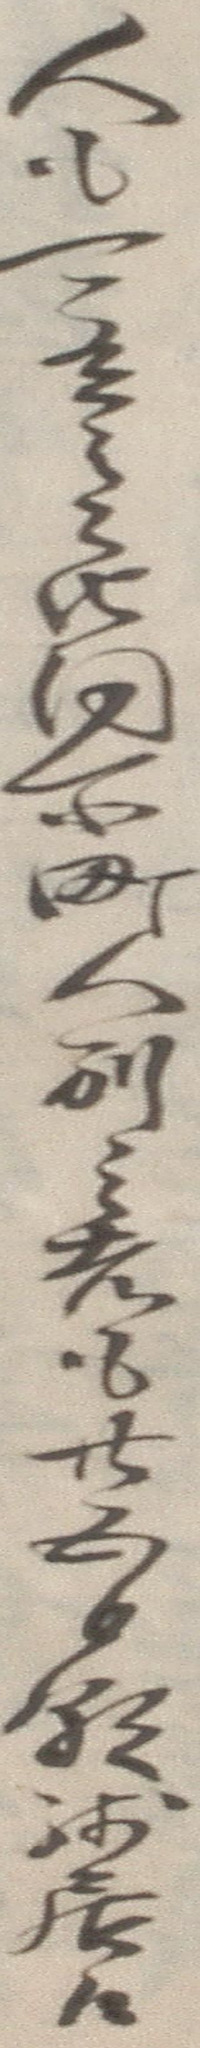人も可有之候由同所町人別之者も廿五日朝残居候
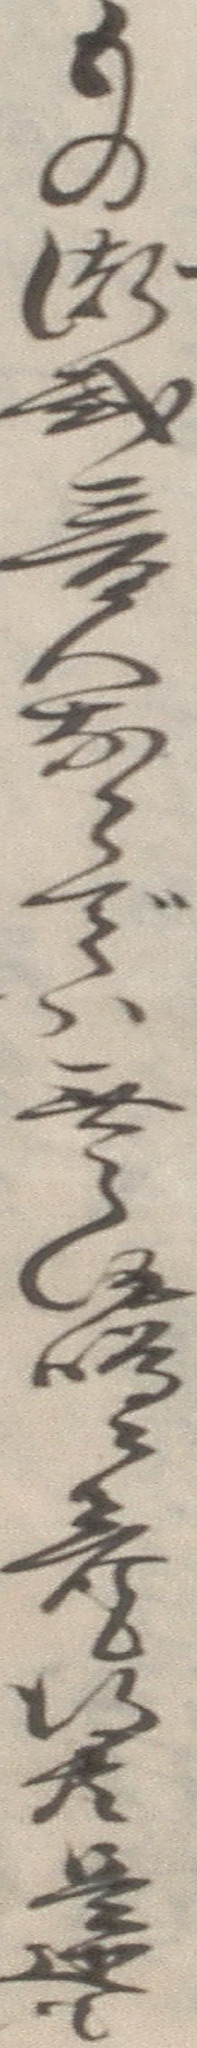もの漸弐三百人ならでハ無之趣噂二御座候得共是迚も
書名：信州地震一件
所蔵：東京大学地震研究所図書室 Earthquake Research Institute Library, The University of Tokyo, JAPAN
